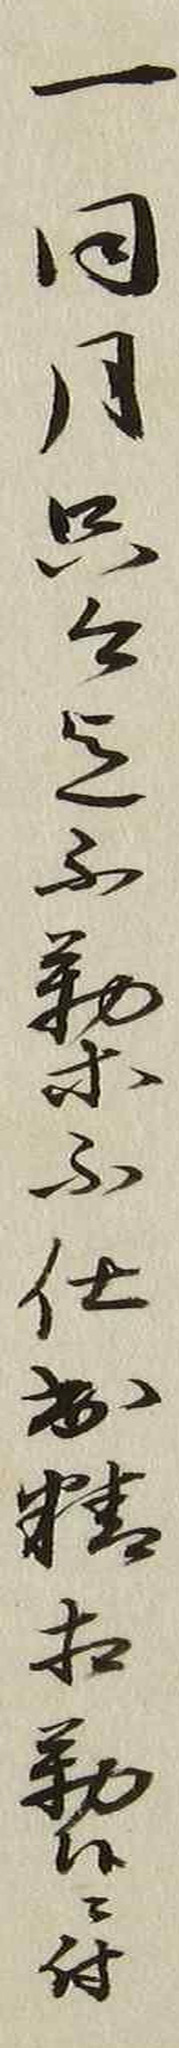一同月只今迄不勤等不仕出精相勤候ニ付
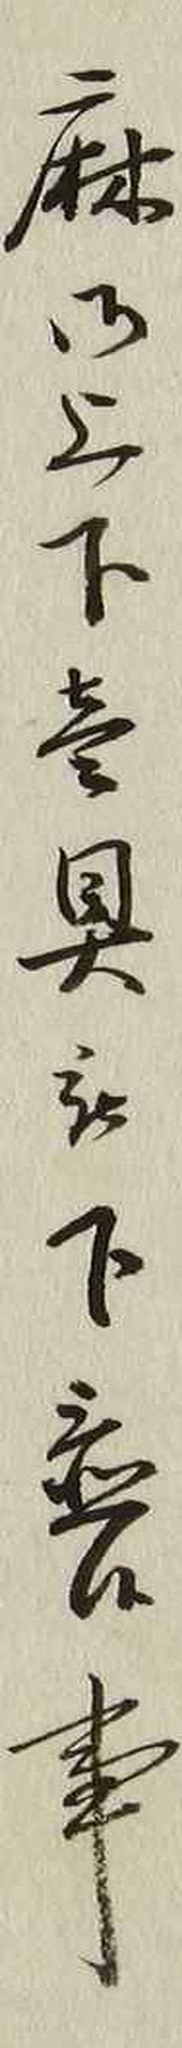麻御上下壱具被下置候事
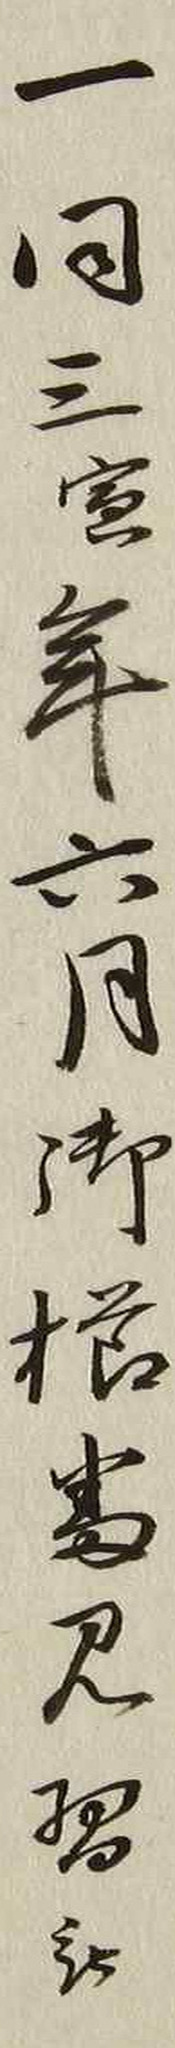一同三寅年六月御櫛番見習被
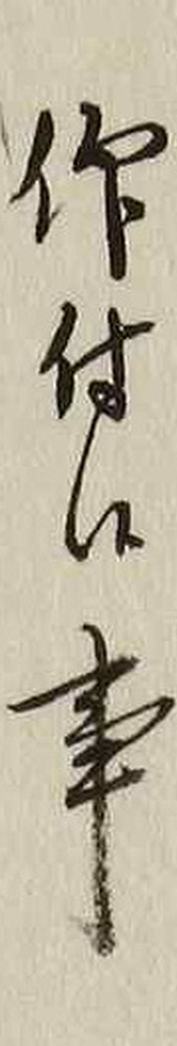仰付候事
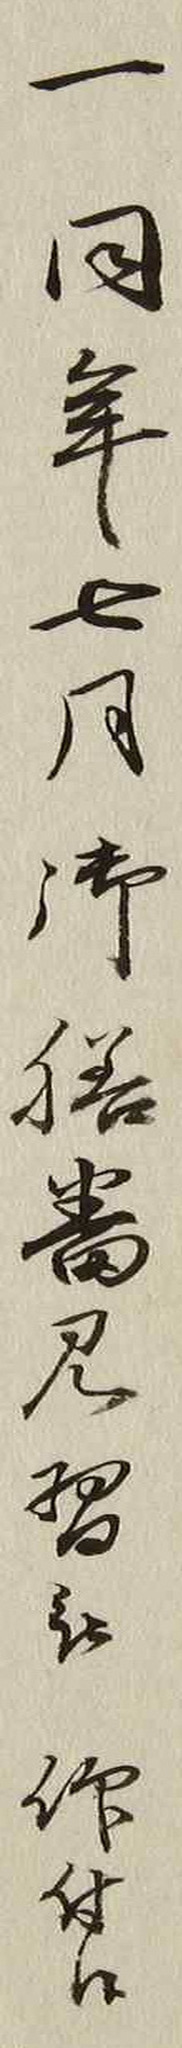一同年七月御膳番見習被仰付候
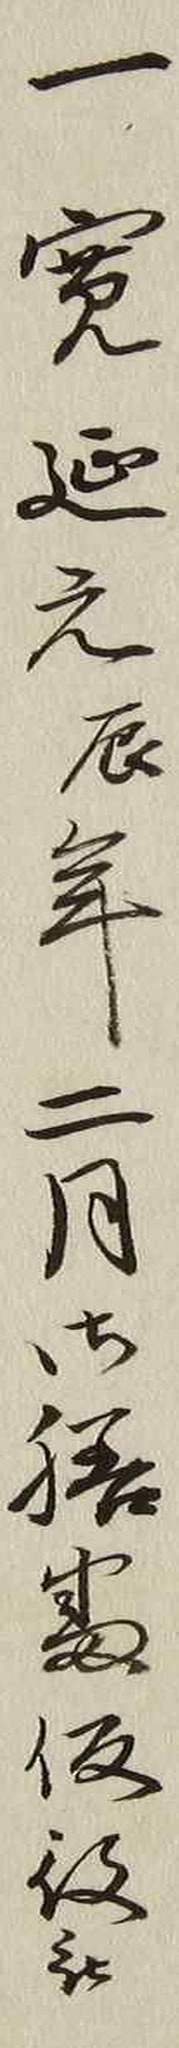一寛延元辰年二月御膳番仮役被
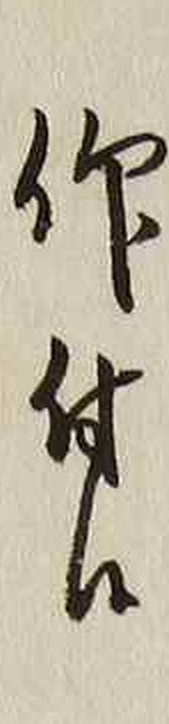仰付候
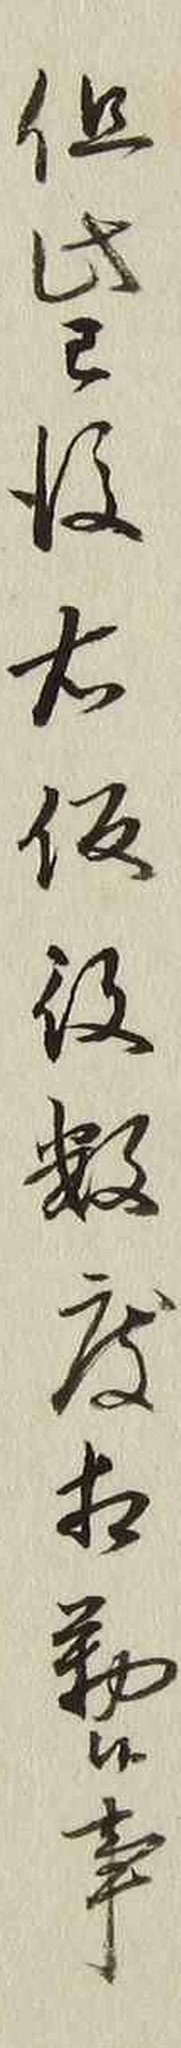但此已後右仮役数度相勤候事
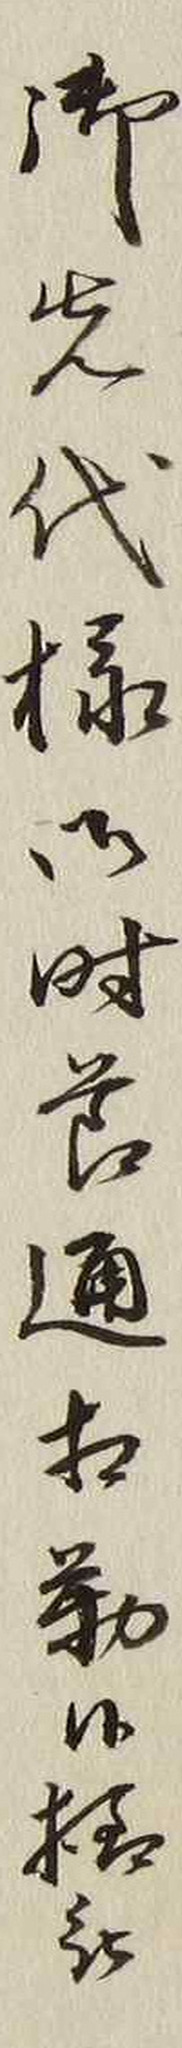御先代様御時節通相勤候様被
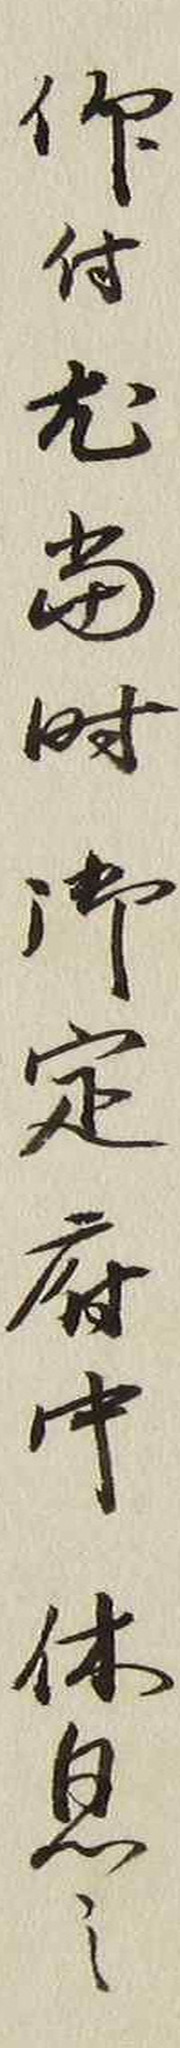仰付尤当時御定府中休息之
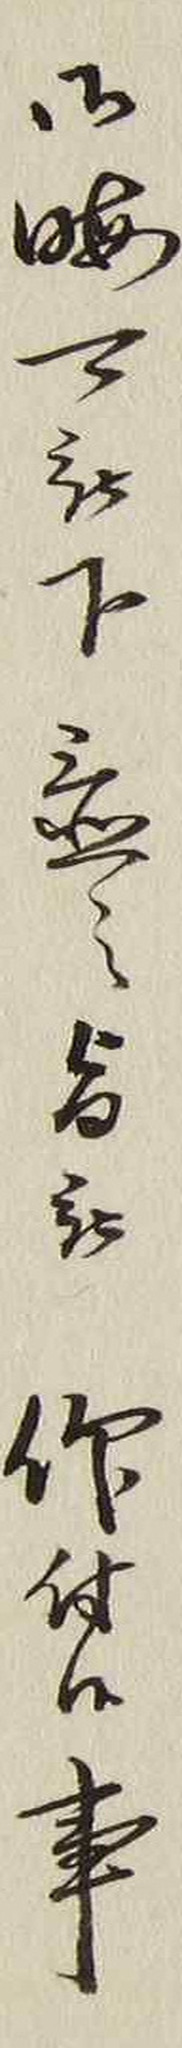御暇可被下置之旨被仰付候事
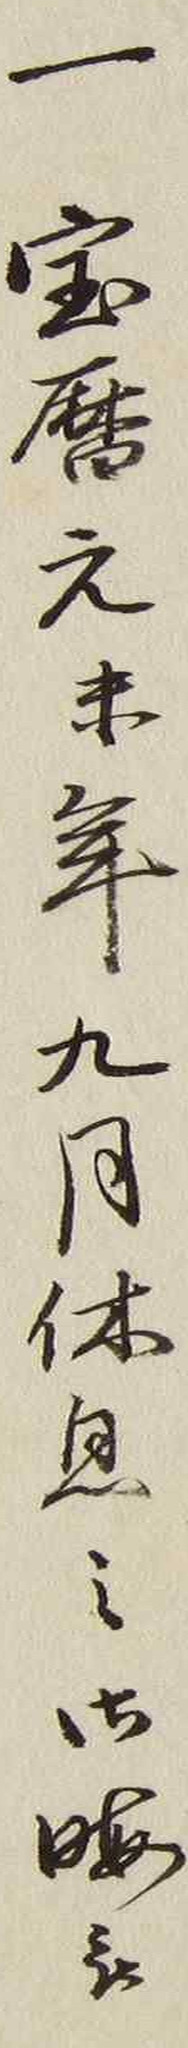一宝暦元未年九月休息之御暇被

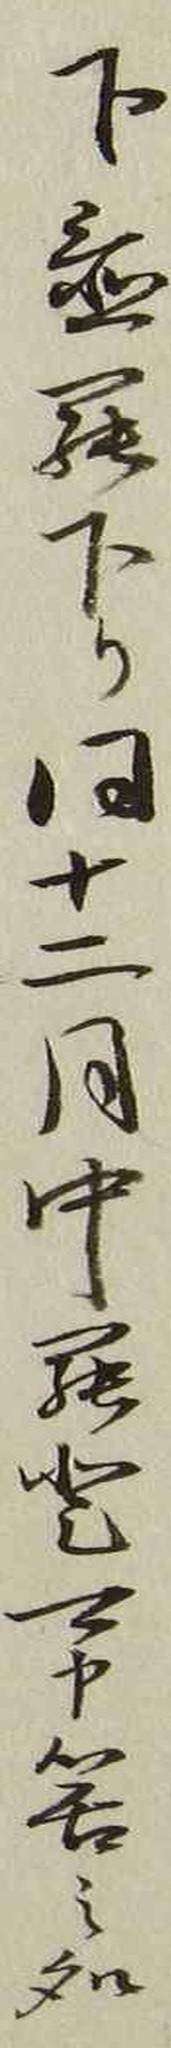下置罷下り同十二月中罷登可申筈之処
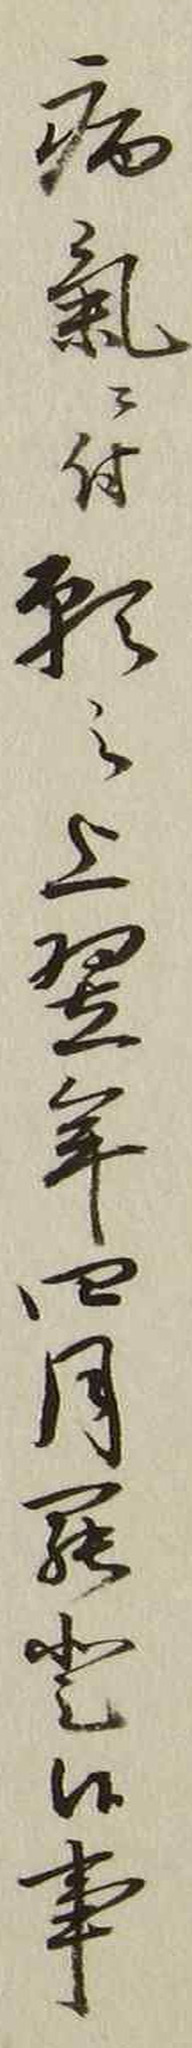病気ニ付願之上翌年四月罷登候事
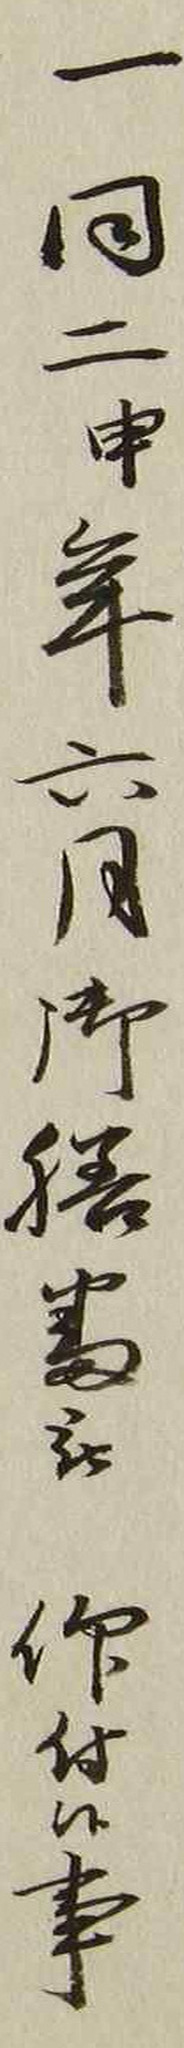一同二申年六月御膳番被仰付候事
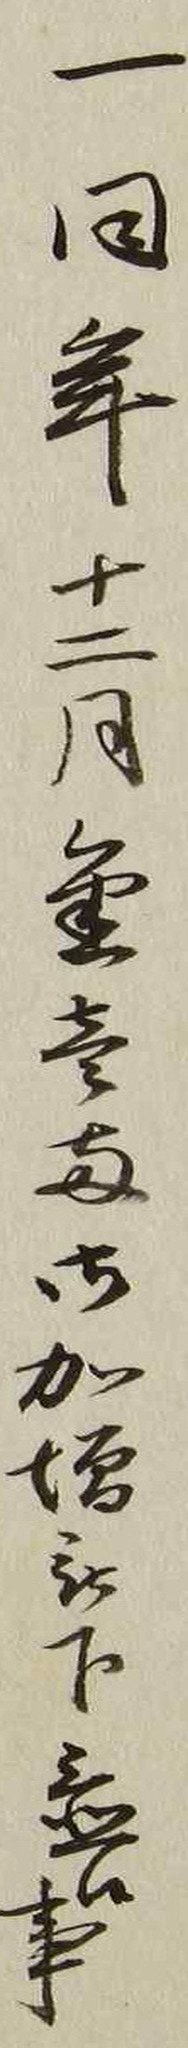一同年十二月金壱両御加増被下置候事
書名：諸士系譜　巻之160　な之部2
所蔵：会津若松市立会津図書館
